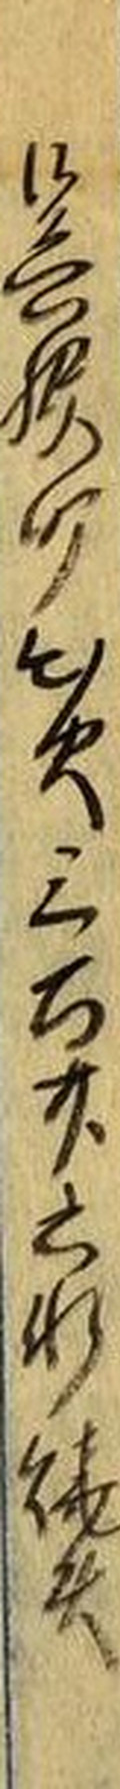呉服町出火三百廿六軒焼失
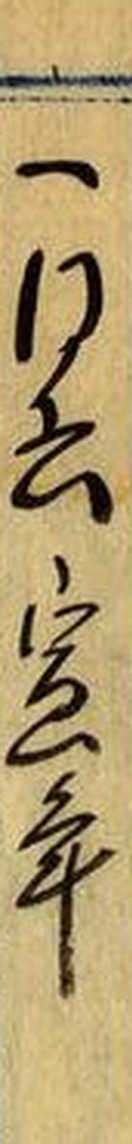一同六寅年
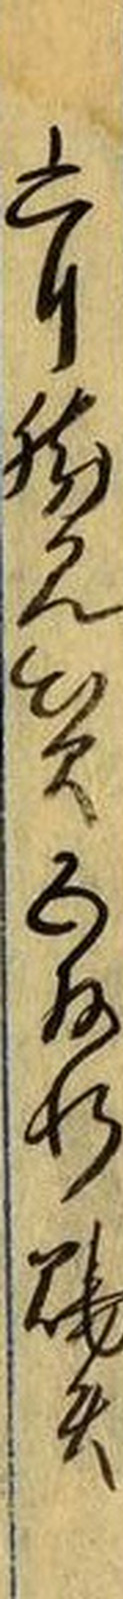六月勝見出火五拾軒焼失
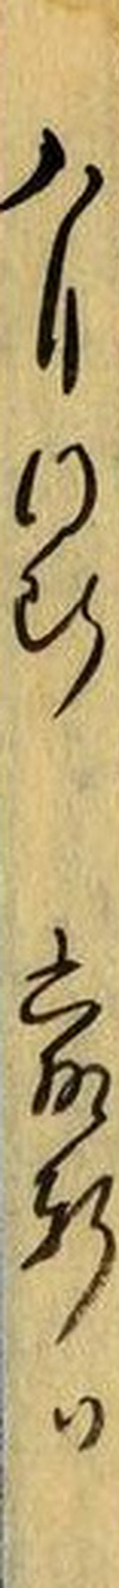八月同断六拾軒同
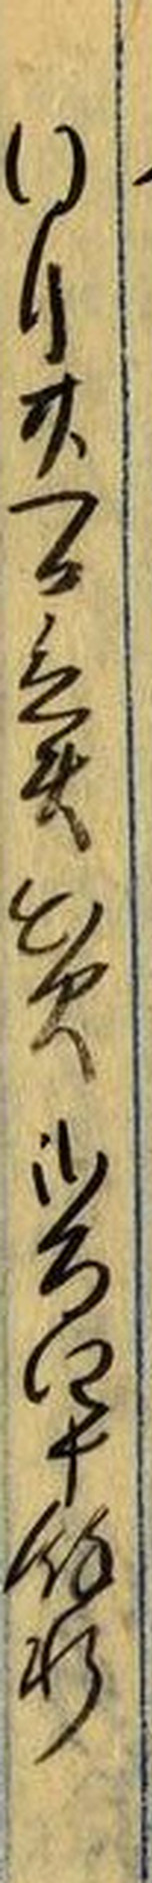同月廿一日立矢出火弐百四十余軒
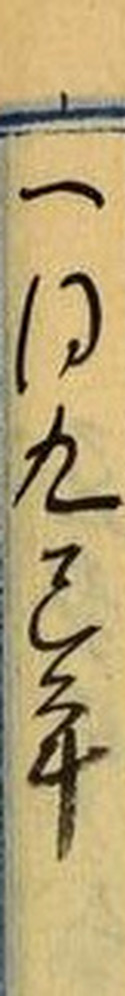一同九巳年
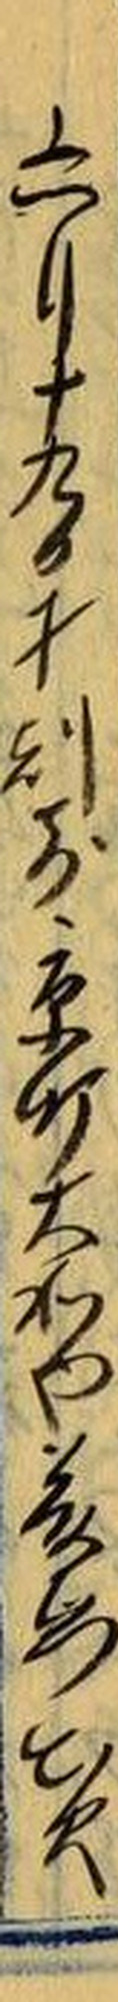六月十九日刁刻前京町大加や藤右衛門出火
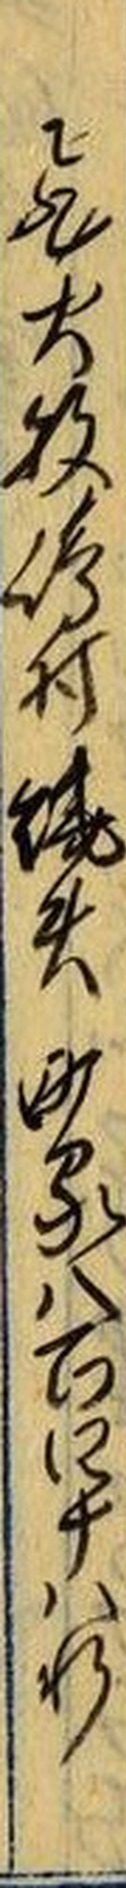飛火牧嶋村焼失町家八百四十八軒
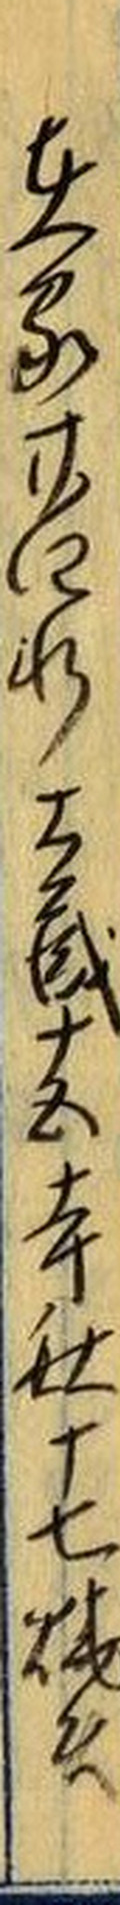在家廿四軒土蔵十五寺社十七焼失
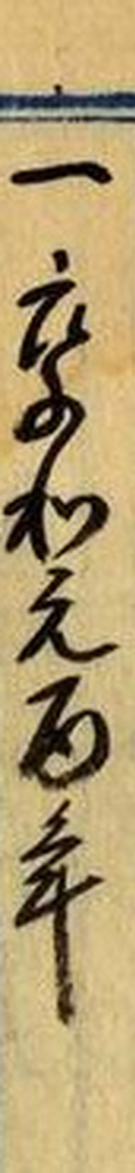一享和元酉年
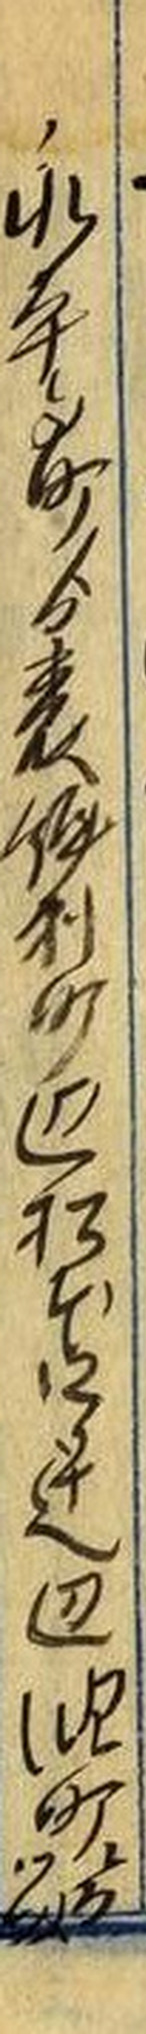永平寺町ゟ表餌刺町辺松本四ッ辻辺油町に而留
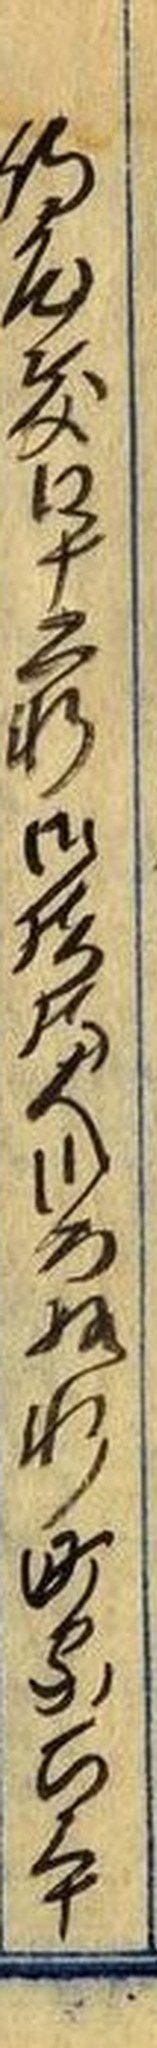侍屋敷四十六軒御扶持人弐百拾軒町家百三十
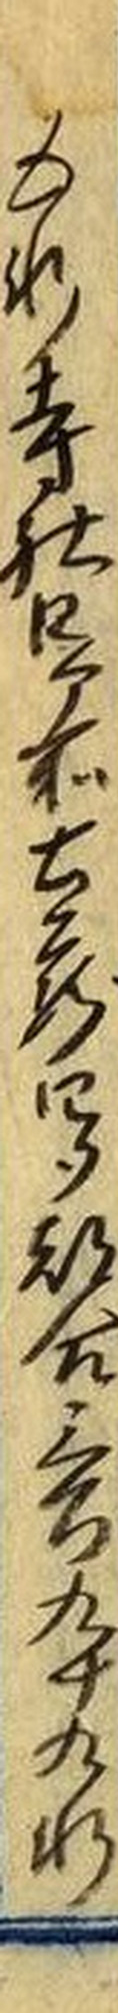五軒寺社四ヶ所土蔵四ッ都合三百九十九軒
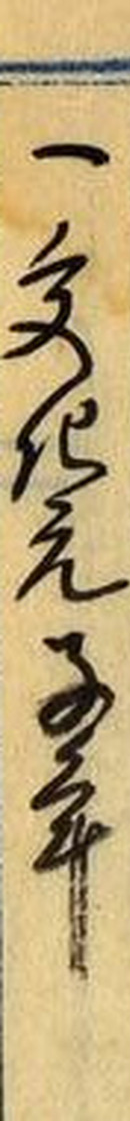一文化元子年

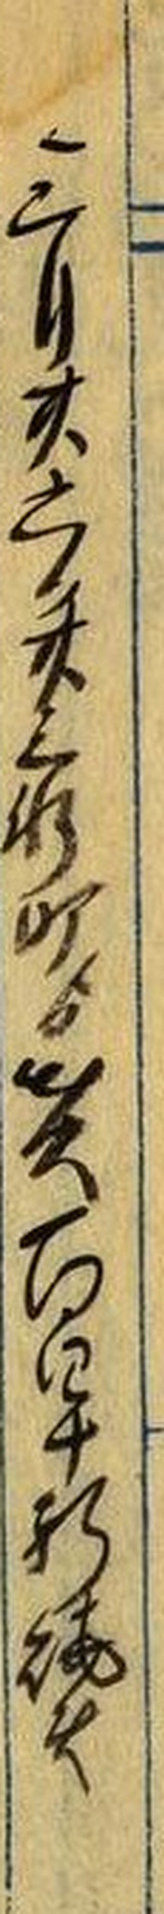三月廿六日廿三軒町ゟ出火百四十軒焼失
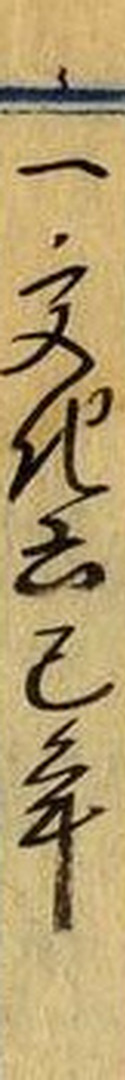一文化六巳年
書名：温古集 五巻
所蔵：福井県文書館 Fukui Prefectural Archives
